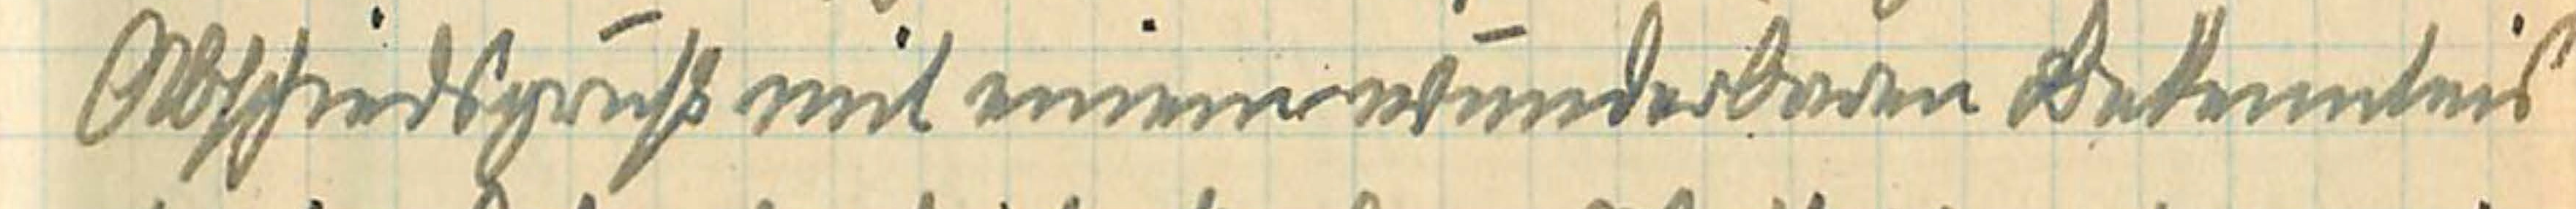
Abschiedsgruß mit einem wunderbaren Bekenntnis
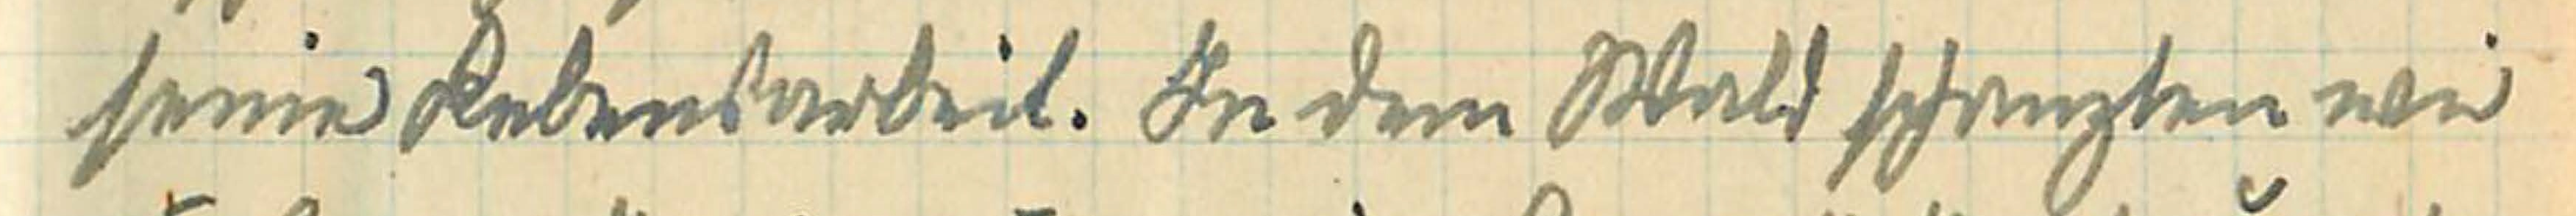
seiner Lebensarbeit. In dem Wald schanzten wir
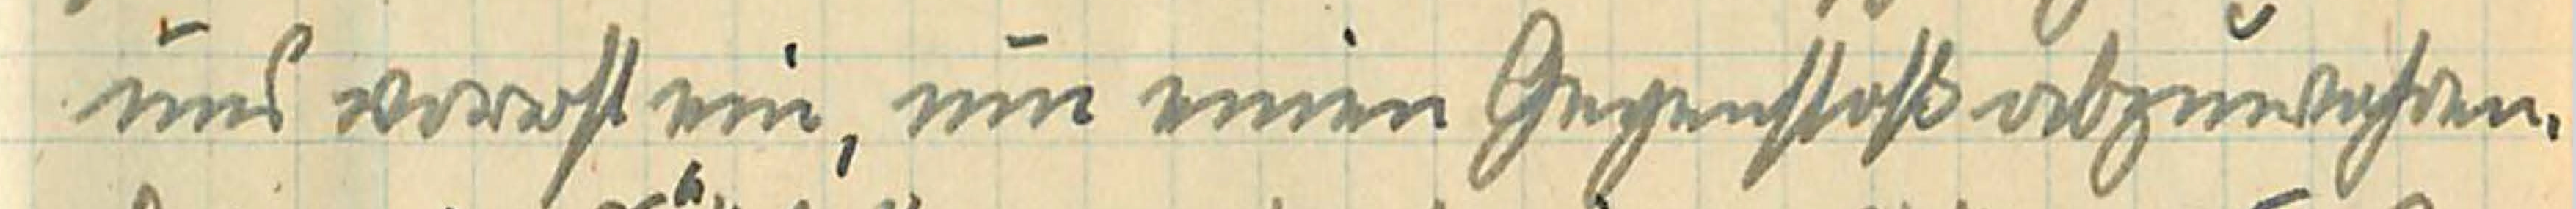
uns vorerst ein, um einen Gegenstoß abzuwehren,
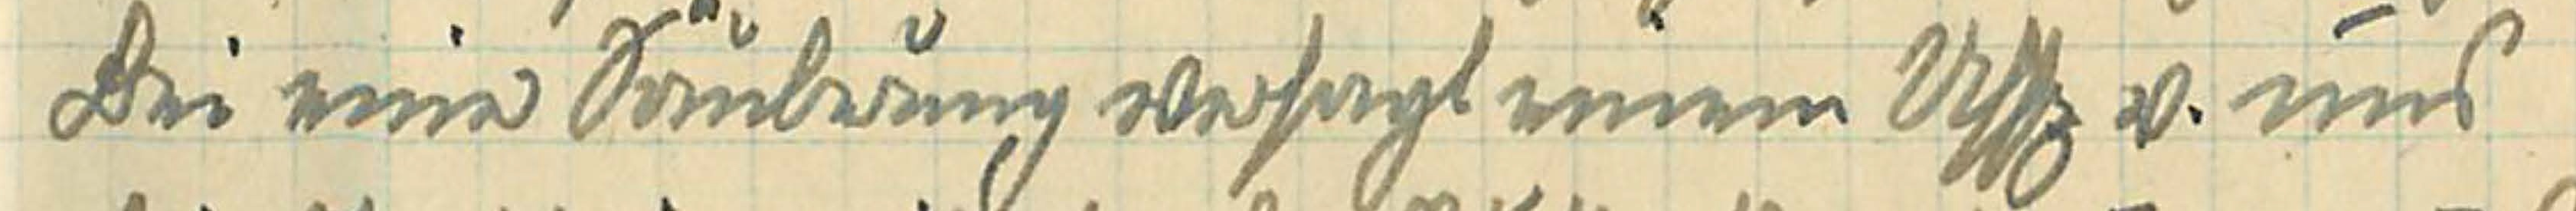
Bei einer Säuberung versagt einem Uffz v. uns
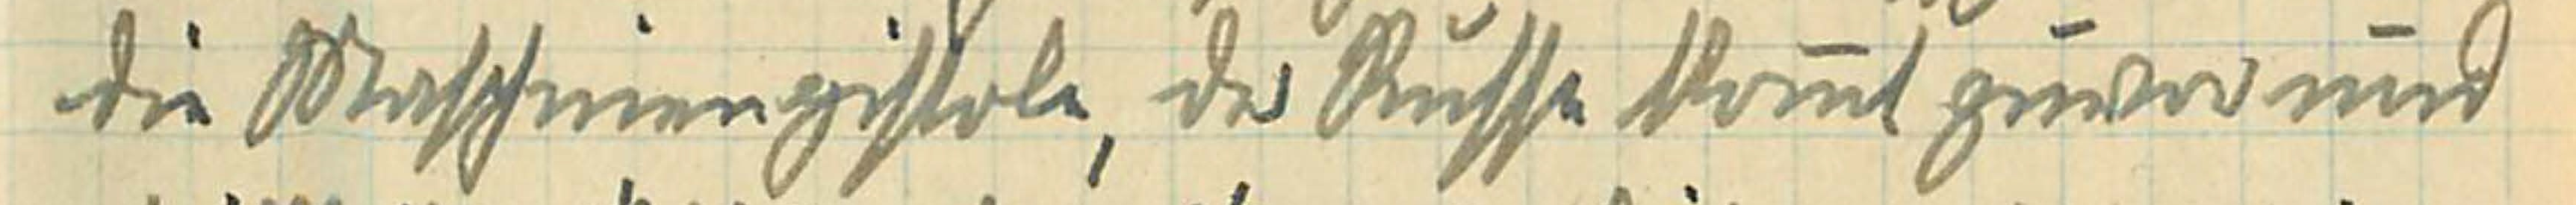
die Maschinenpistole, der Russe kommt zuvor und
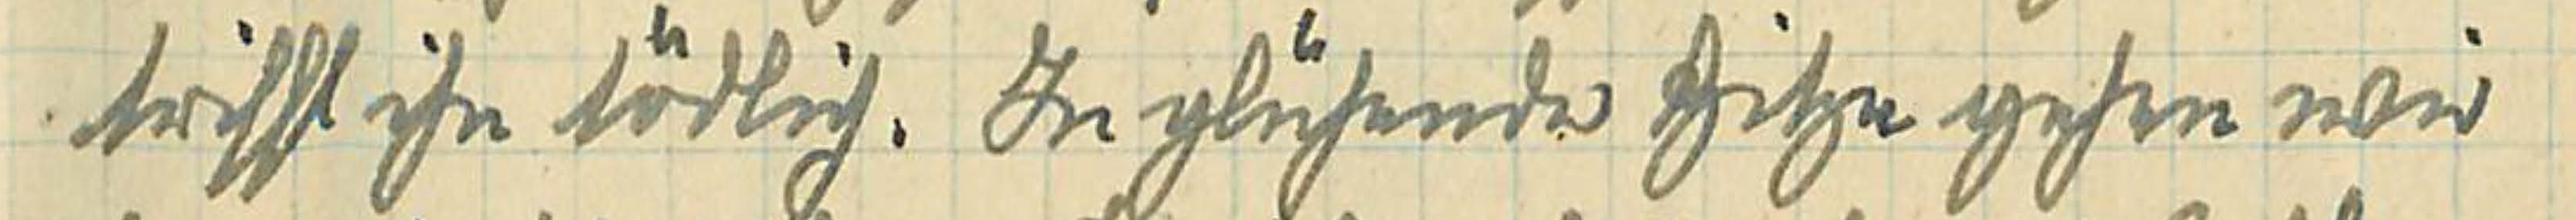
trifft ihn tödlich. In glühender Hitze gehen wir
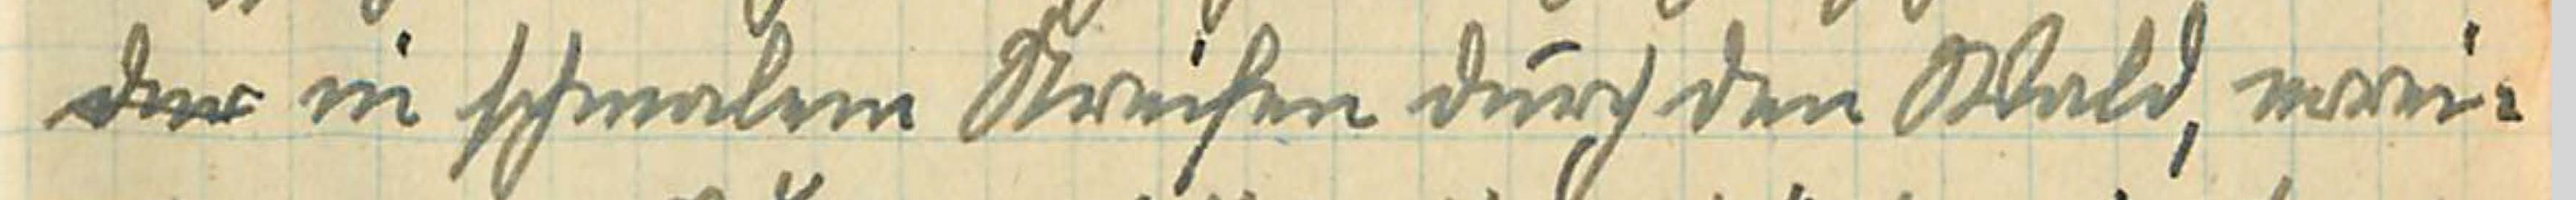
der in schmalem Streifen durch den Wald, errei-
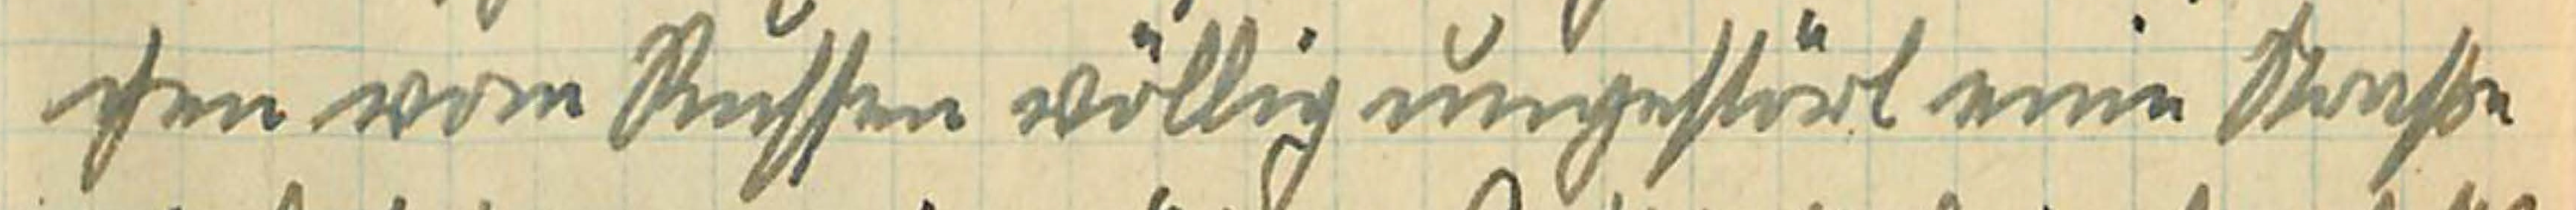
chen vom Russen völlig ungestört eine Straße
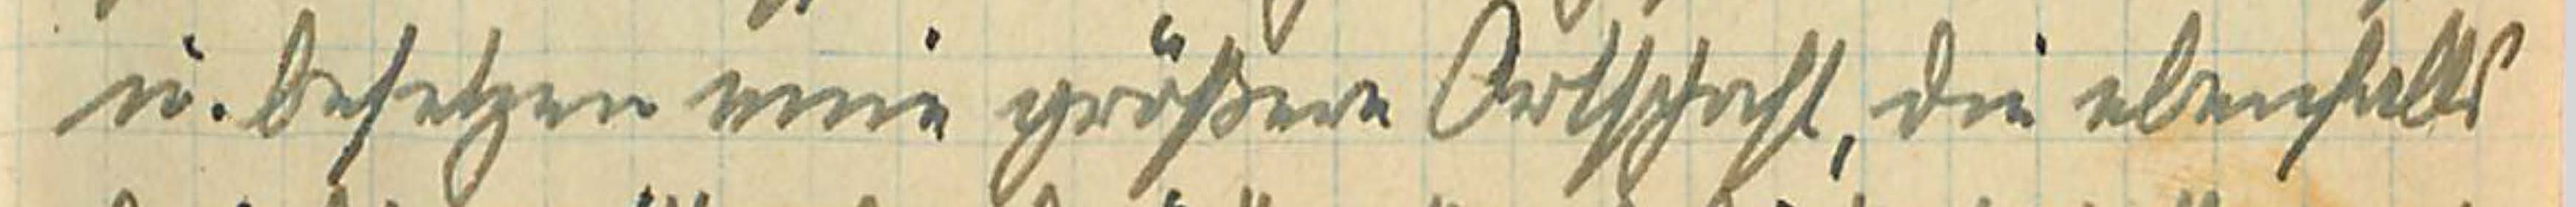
u. besetzen eine größere Ortschaft, die ebenfalls
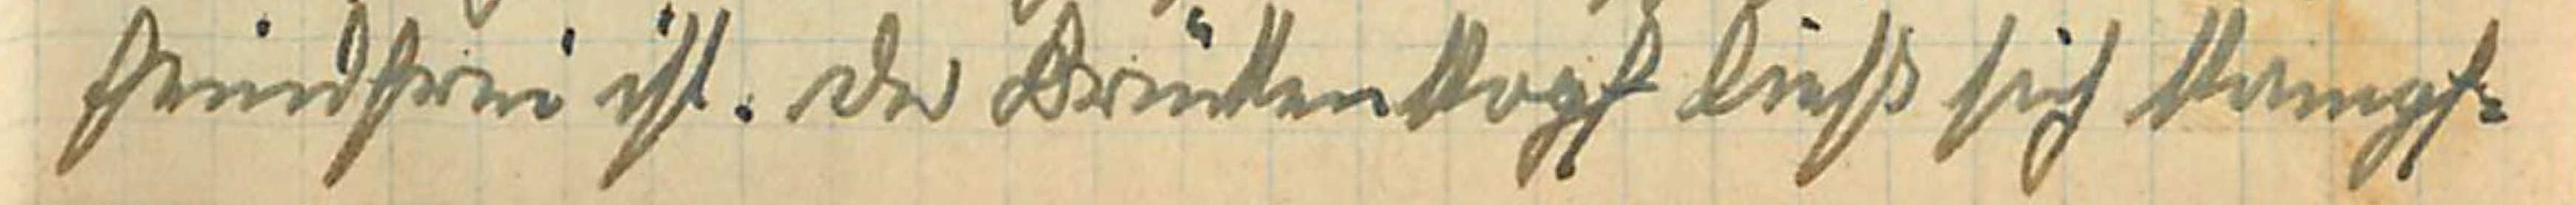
feindfrei ist. Der Brückenkopf ließ sich kampf-
